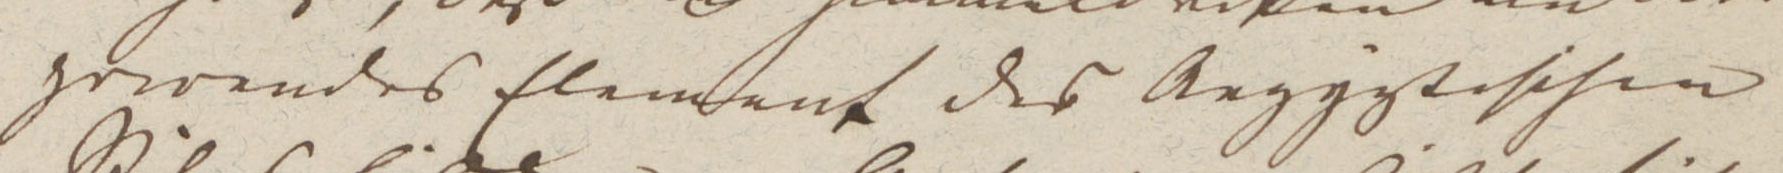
grirendes Element des Aegyptischen
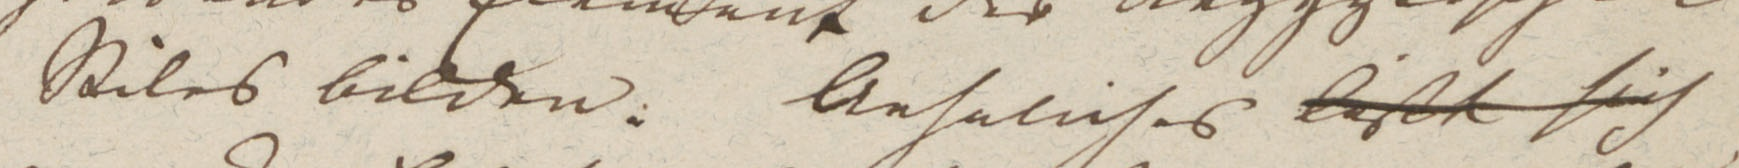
Stiles bilden. Aehnliches lässt sich
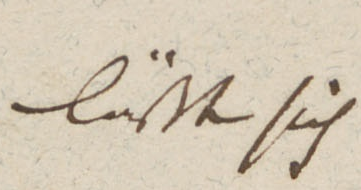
lässt sich
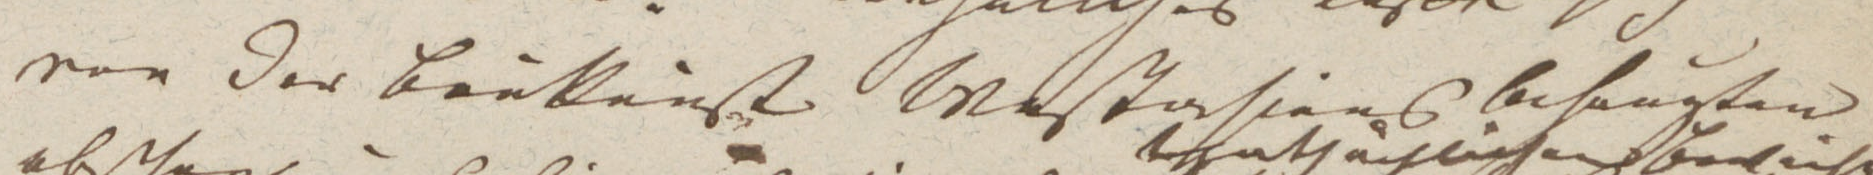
von der Baukunst Westasiens behaupten
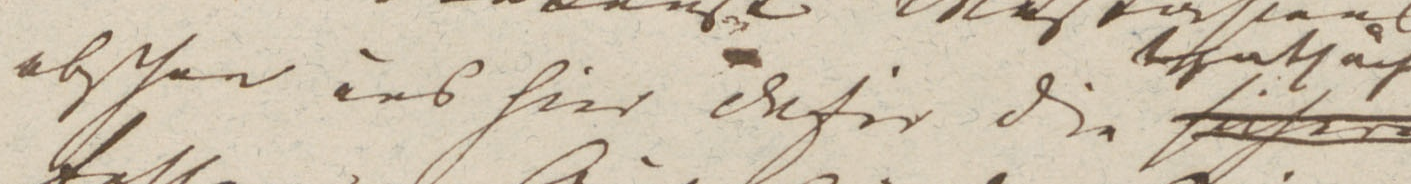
obschon uns hier dafür die sicheren
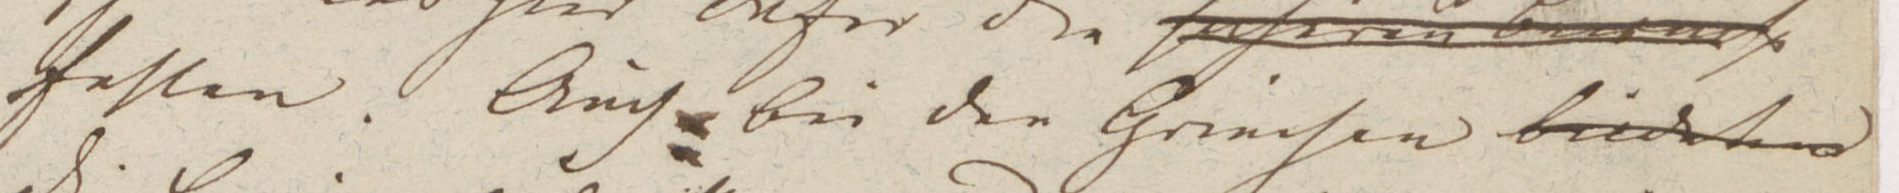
fehlen. Auch bei den Griechen bildeten
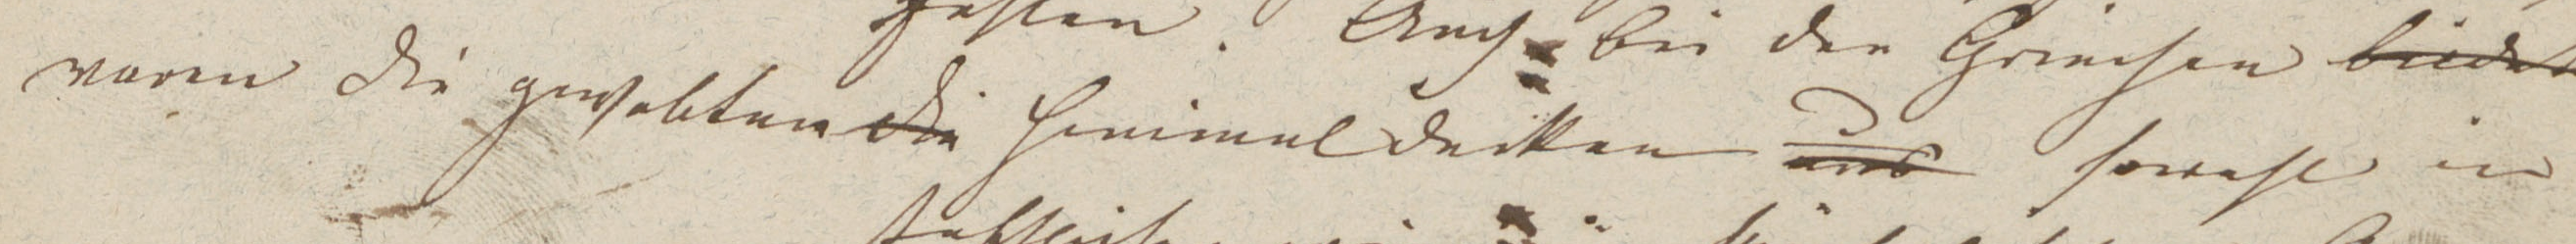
waren die gewebten die Himmeldecken aus sowohl in
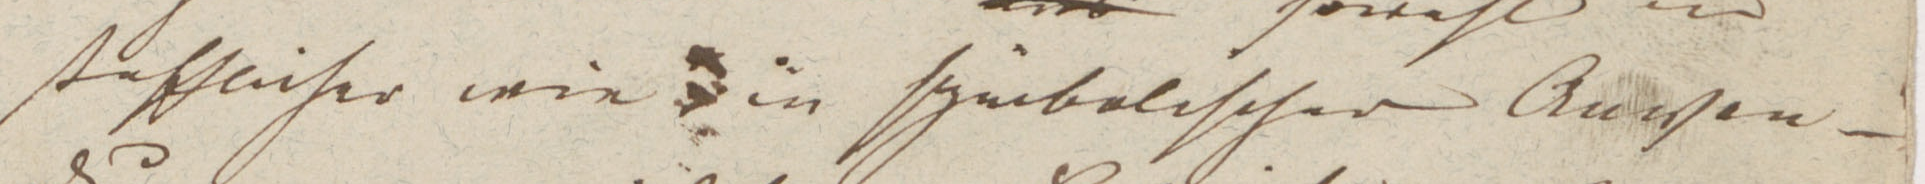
stofflicher wie in symbolischer Anwen-
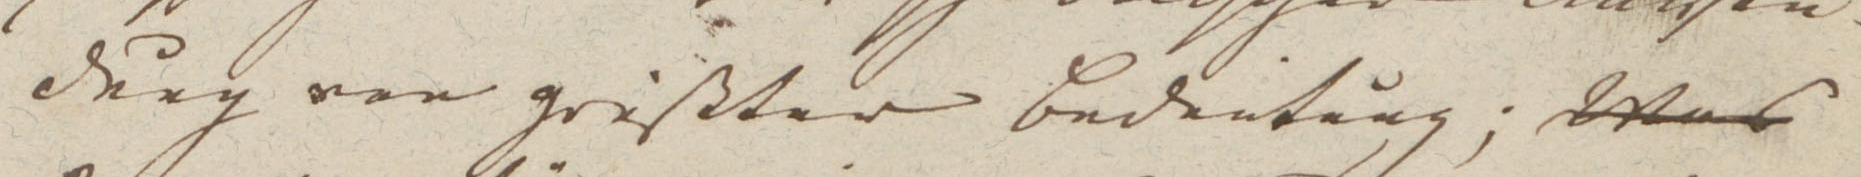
dung von grösster Bedeutung; Was
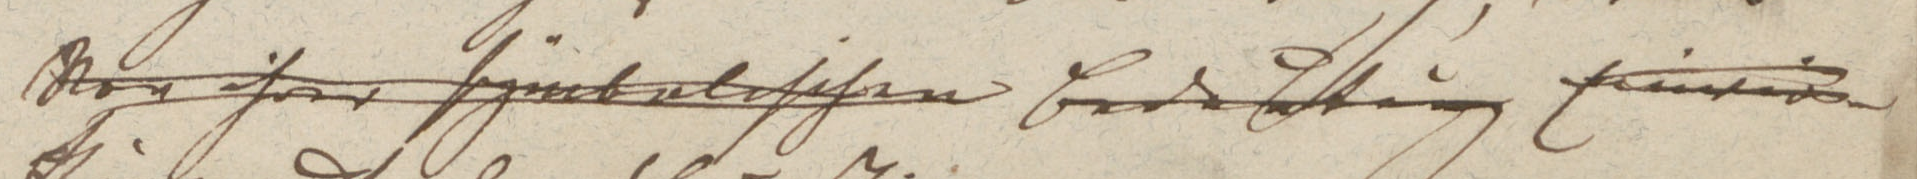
Von ihrer symbolischen Bedeutung Einwir-
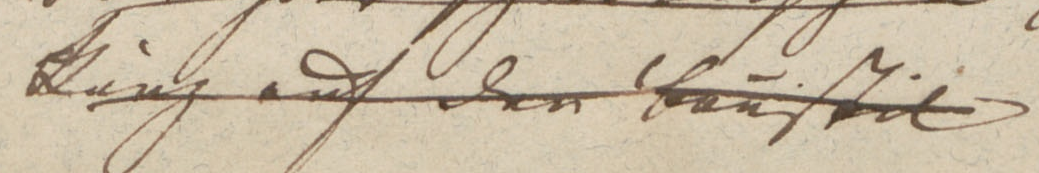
kung auf den Baustil
